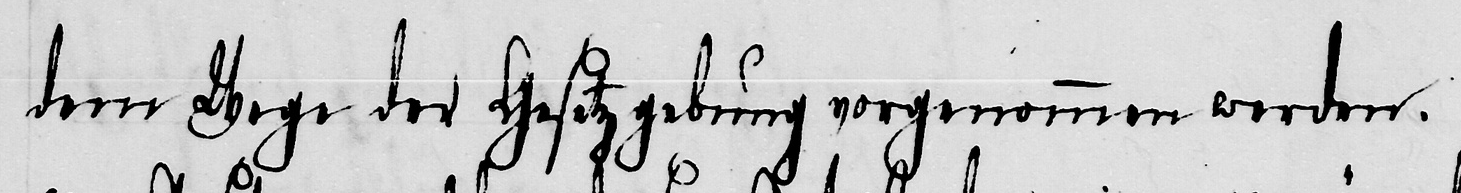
dem Wege der Gesetzgebung vorgenommen werden.
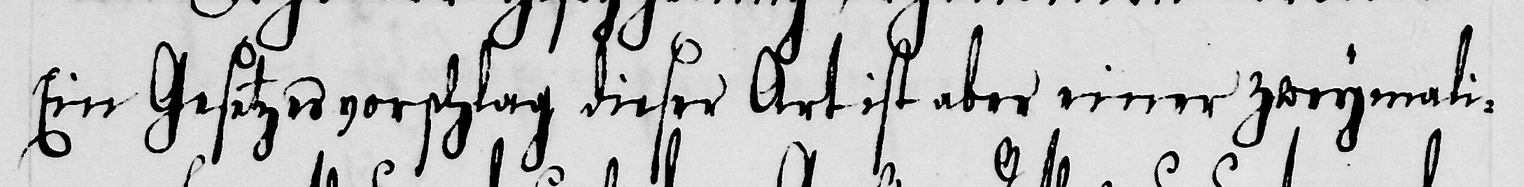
Ein Gesetzesvorschlag dieser Art ist aber einer zweymali¬
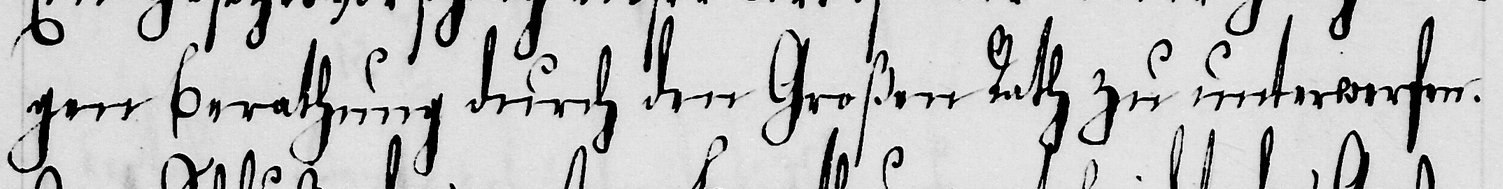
gen Berathung durch den Großen Rath zu unterwerfen.
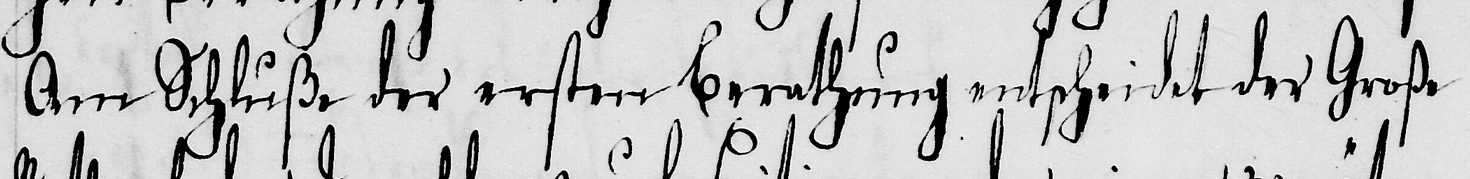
Am Schluße der ersten Berathung entscheidet der Große
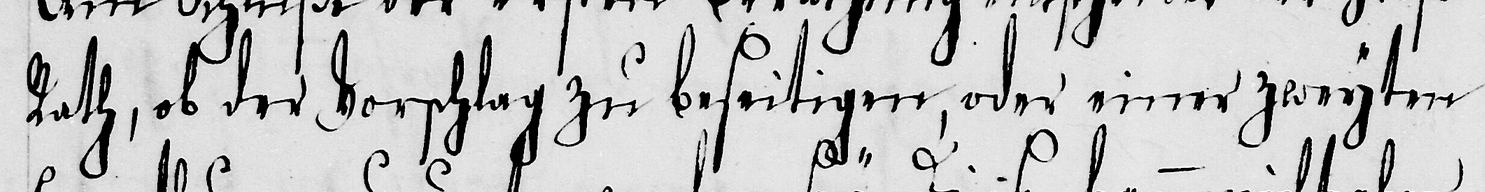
Rath, ob der Vorschlag zu beseitigen, oder einer zweyten
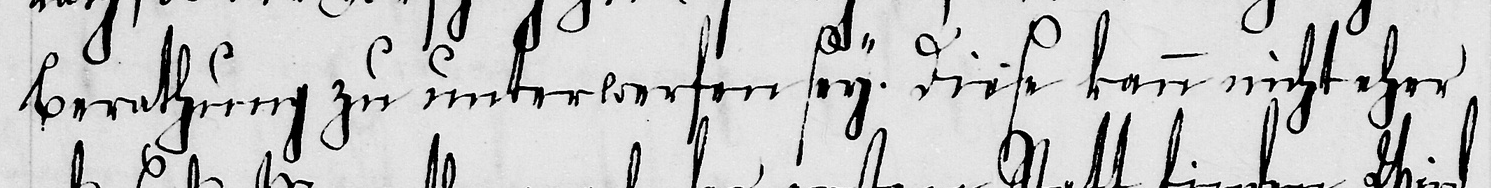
Berathung zu unterwerfen sey. Diese kann nicht eher
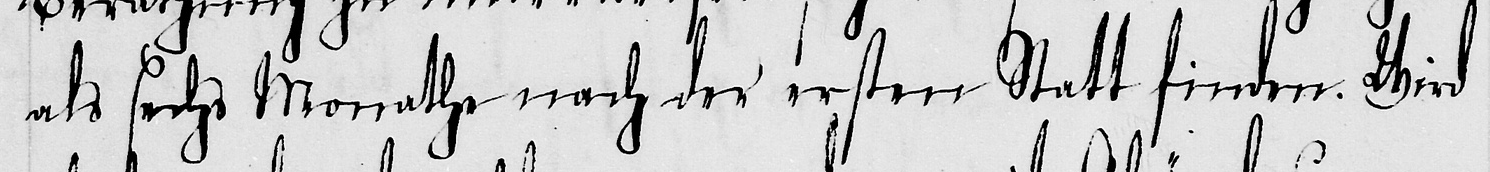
als sechs Monathe nach der ersten Statt finden. Wird
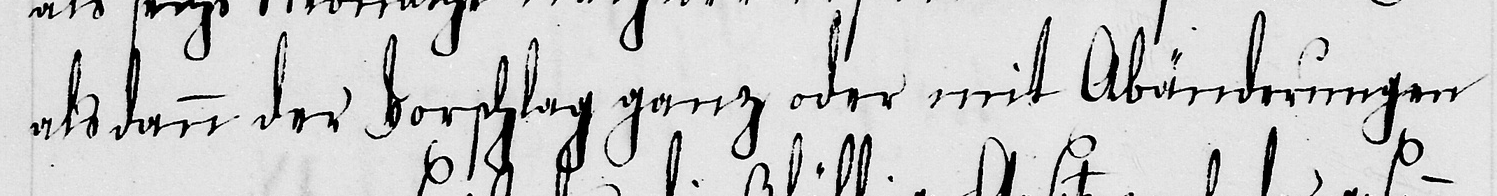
alsdann der Vorschlag ganz oder mit Abänderungen
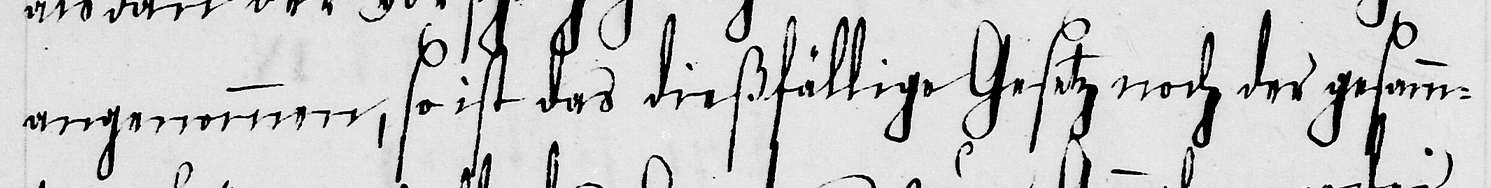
angenommen, so ist das dießfällige Gesetz noch der gesamm¬
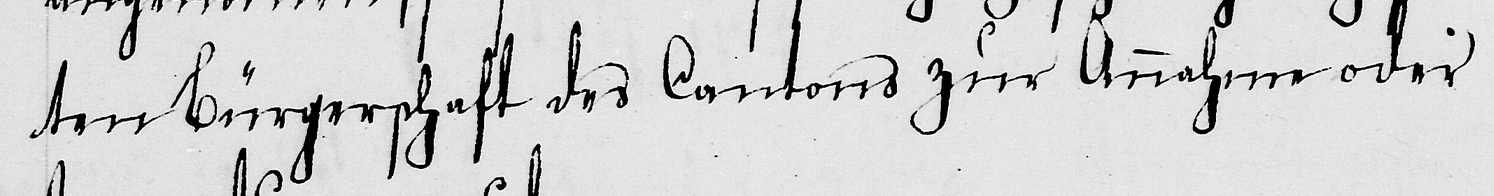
ten Bürgerschaft des Cantons zur Annahme oder
